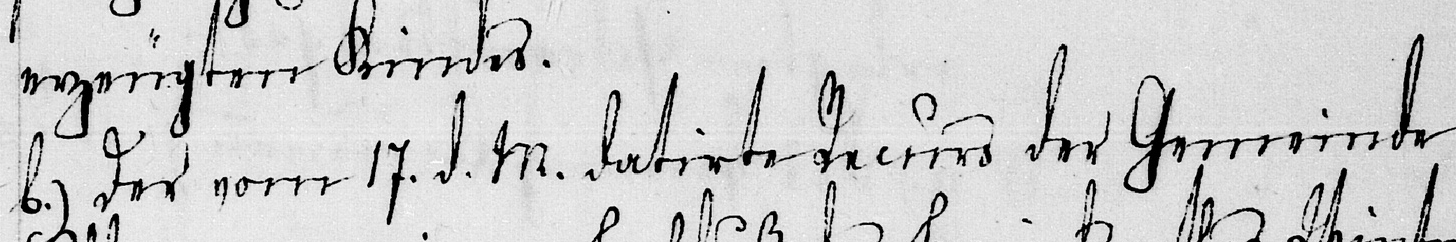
b.) Der vom 17. d. M. datirte Recurs der Gemeinde
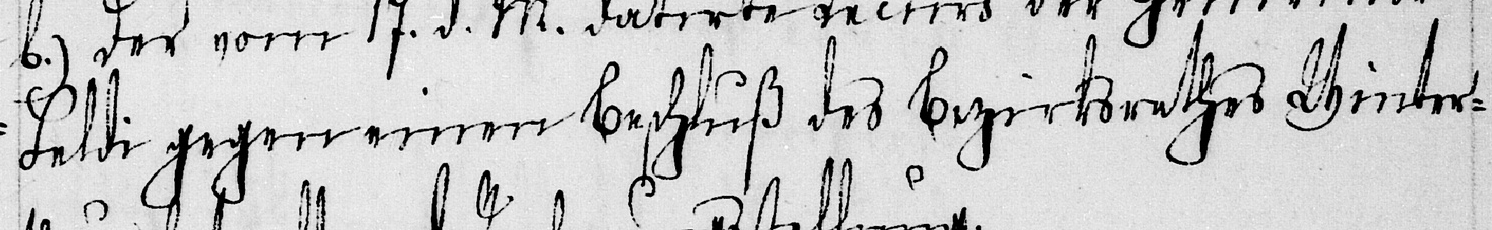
Feldi gegen einen Beschluß des Bezirksrathes Winter¬
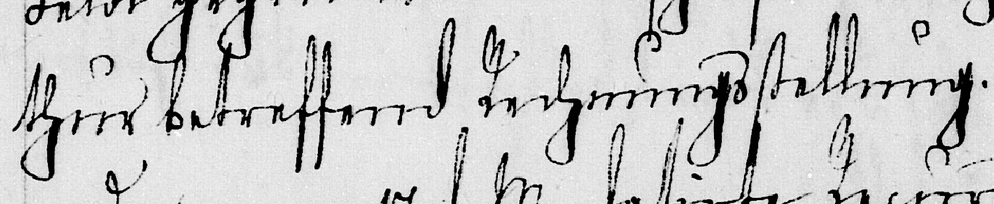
thur betreffend Rechnungsstellung.
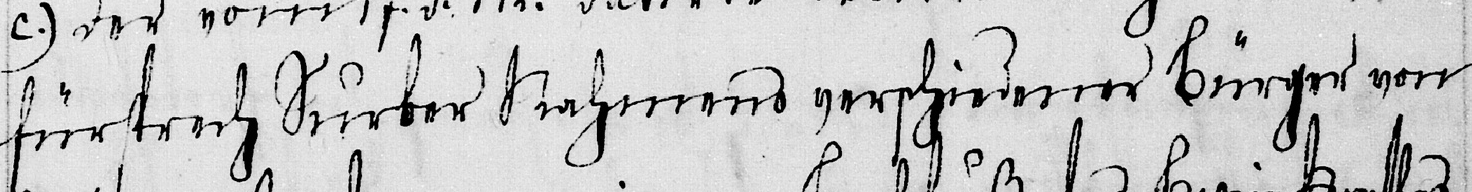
fürsprech Surber Nahmens verscheidender Bürger von
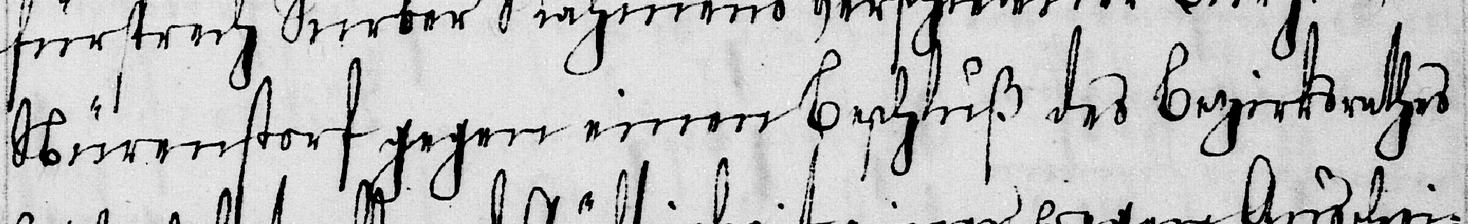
Nürenstorf gegen einen Beschluß des Bezirksrathes
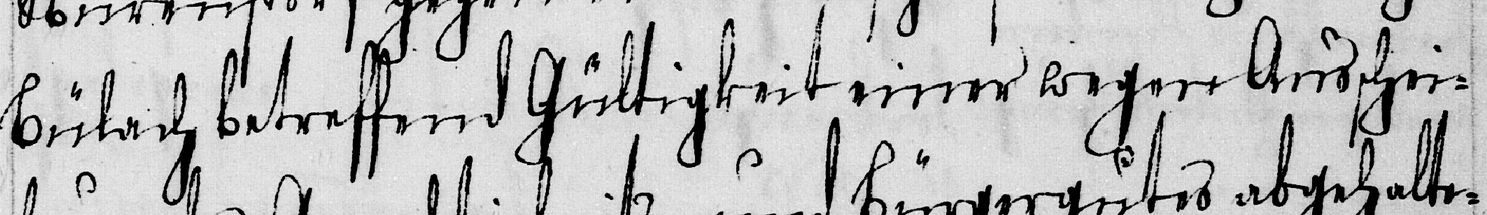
Bülach betreffend Gültigkeit einer wegen Ausschei¬
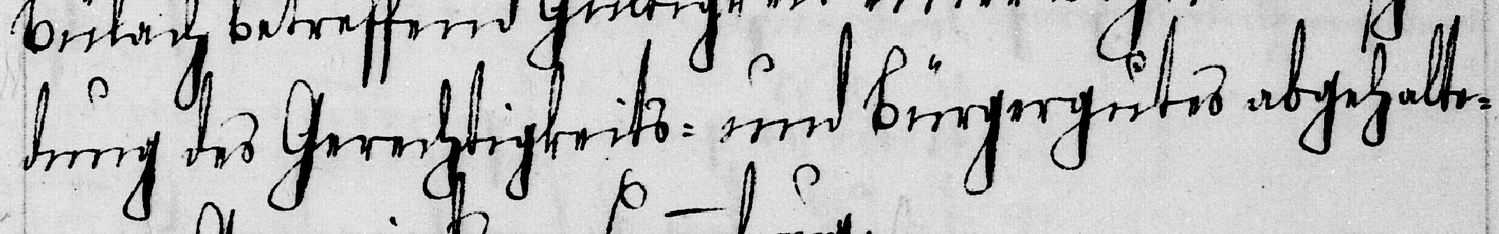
dung des Gerechtigkeits- und Bürgergutes abgehalte¬
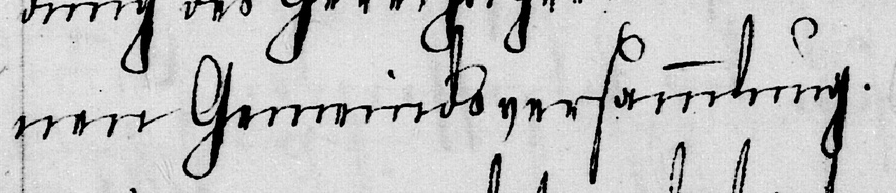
nen Gemeindsversammlung.
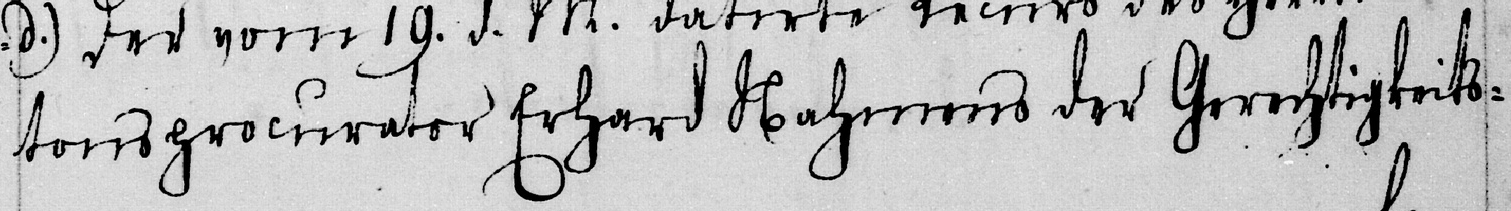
tonsprocurator Erhard Nahmens der Gerechtigkeits-
